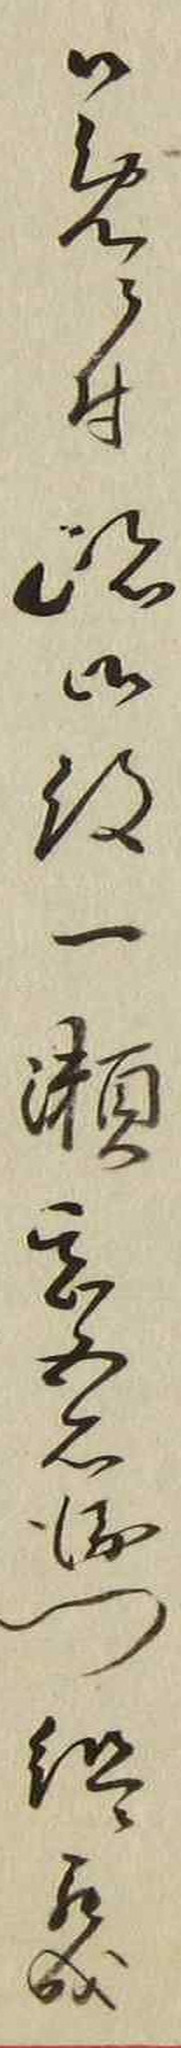御免ニ付跡御役一瀬甚五右衛門組ニ罷成
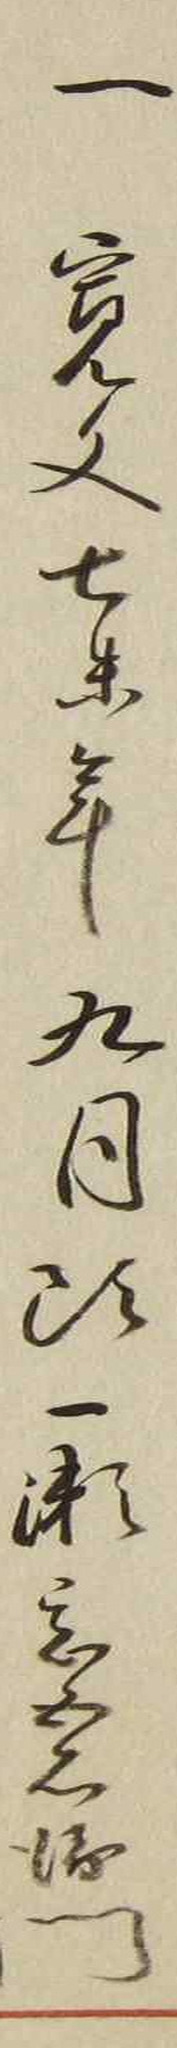一寛文七未年九月頭一瀬甚五右衛門

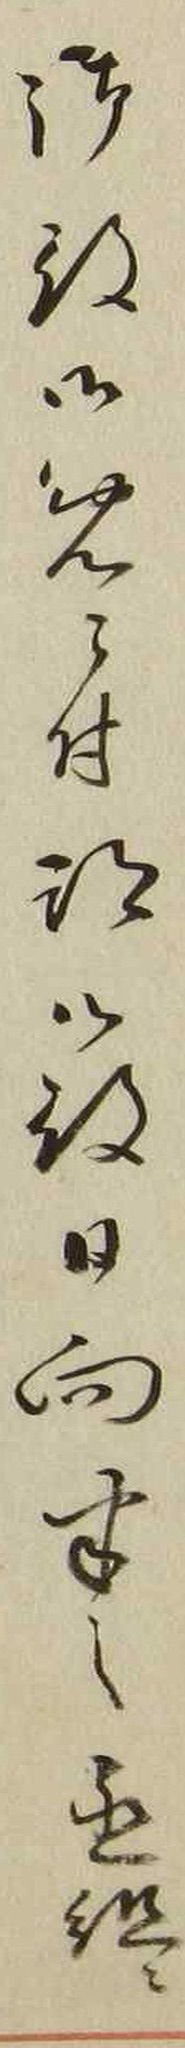御役御免ニ付跡御役日向半之丞組ニ
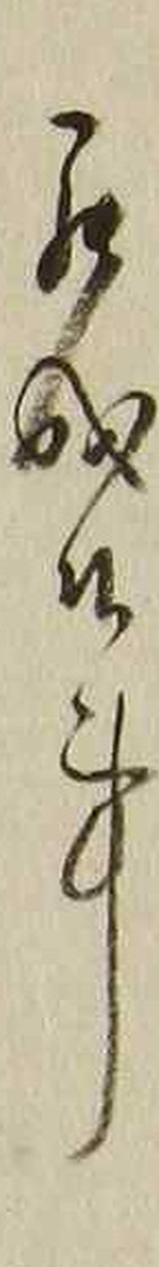罷成候事
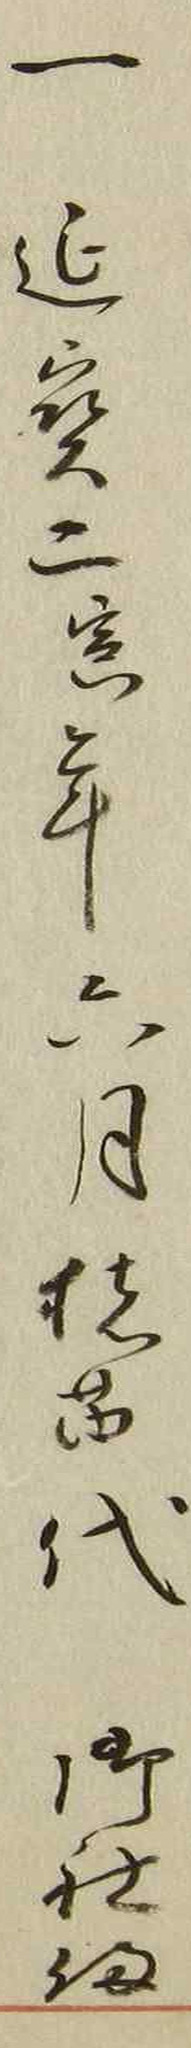一延宝二寅年六月猪苗代御社備
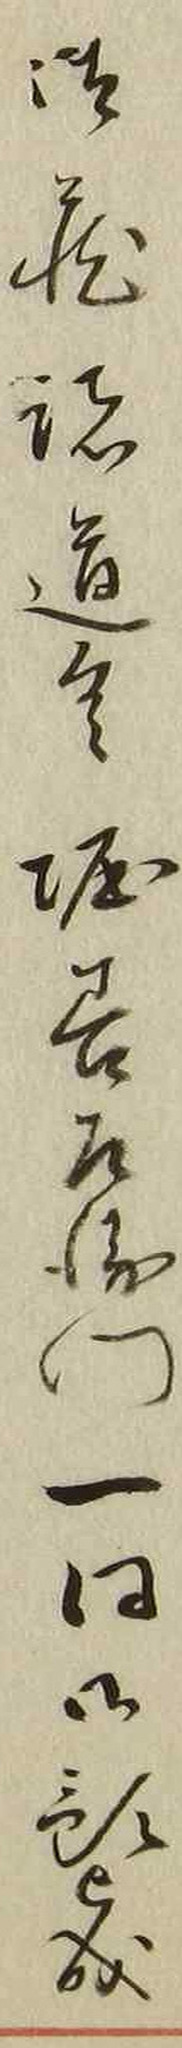御蔵諸道具堀善左衛門一同御預被成
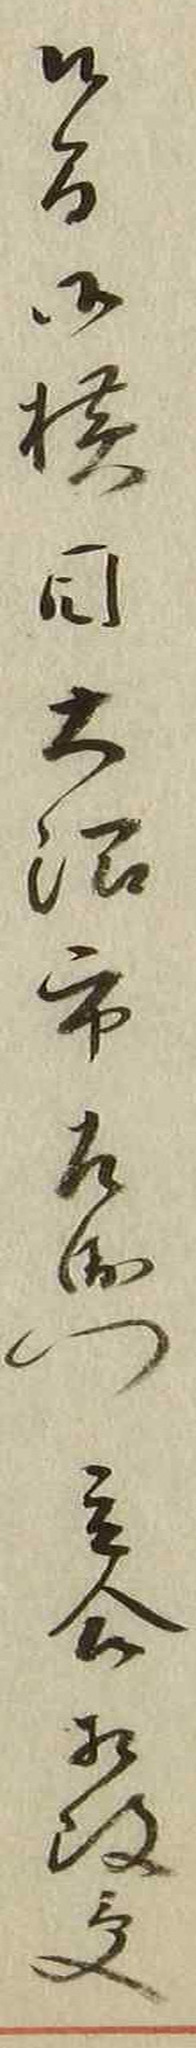候旨御横目大沼市左衛門立合相改受
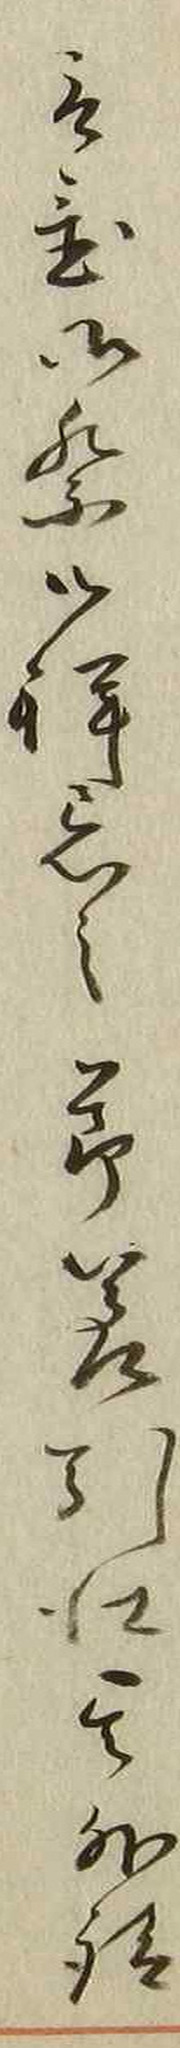取置御祭御祥忌之節差引仕其外請
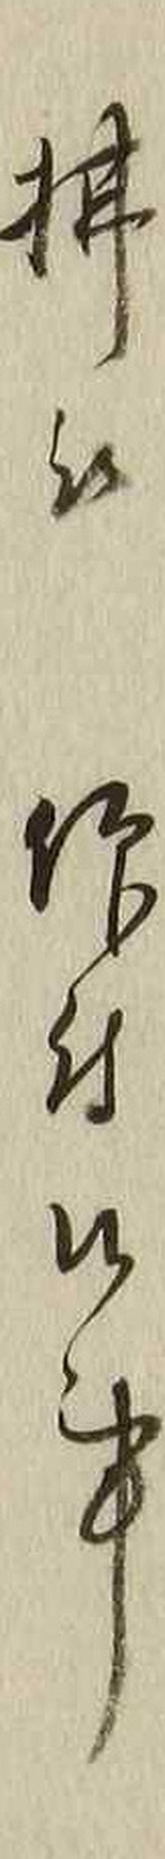払被仰付候事
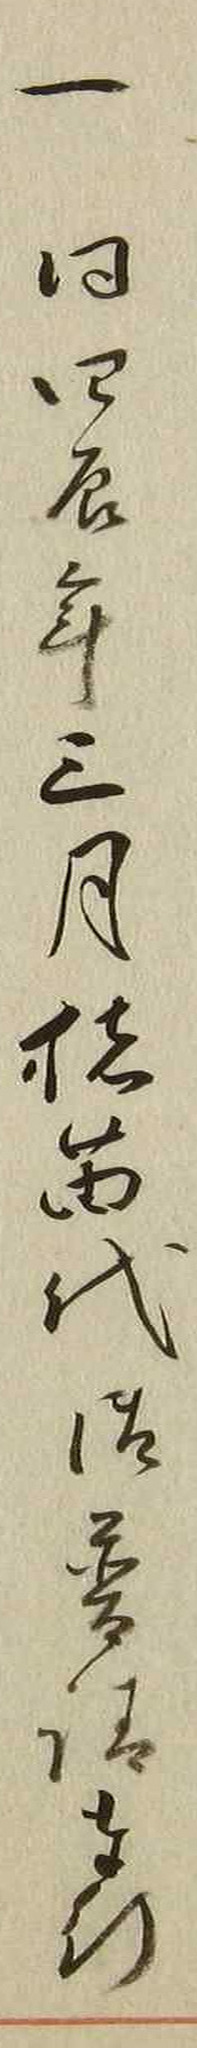一同四辰年三月猪苗代御普請奉行
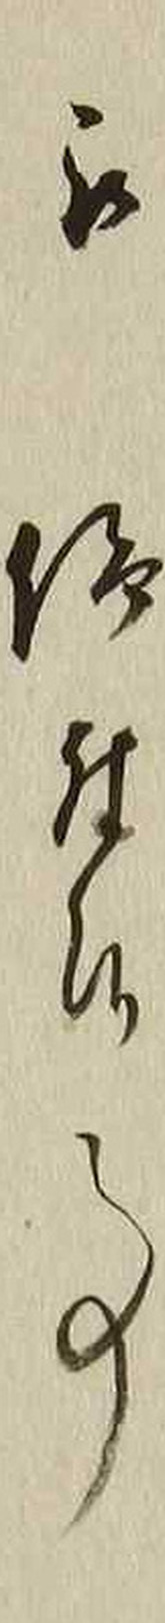被仰付候事
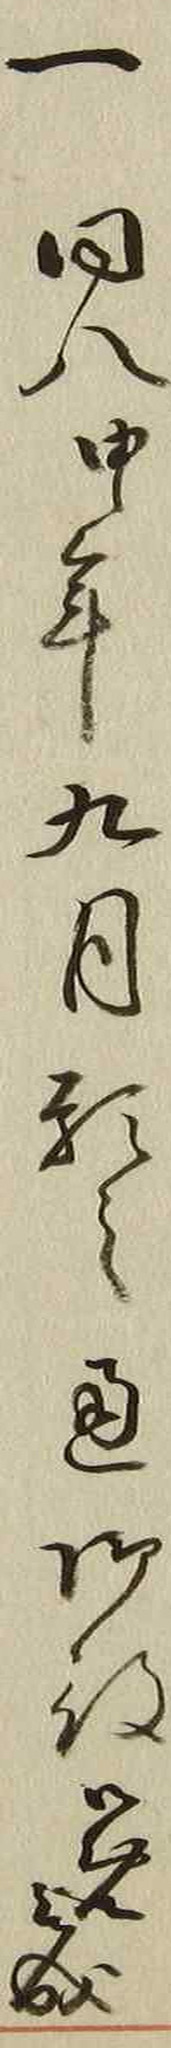一同八申年九月願之通御役御免被成
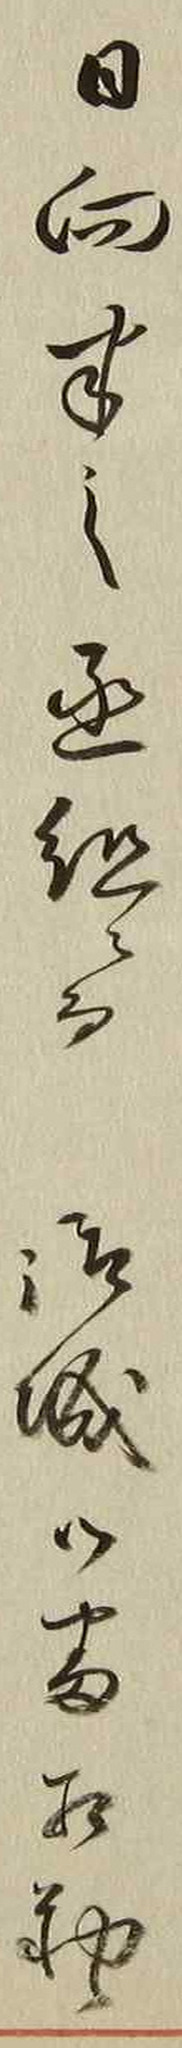日向半之丞組ニ而御城御番相勤候
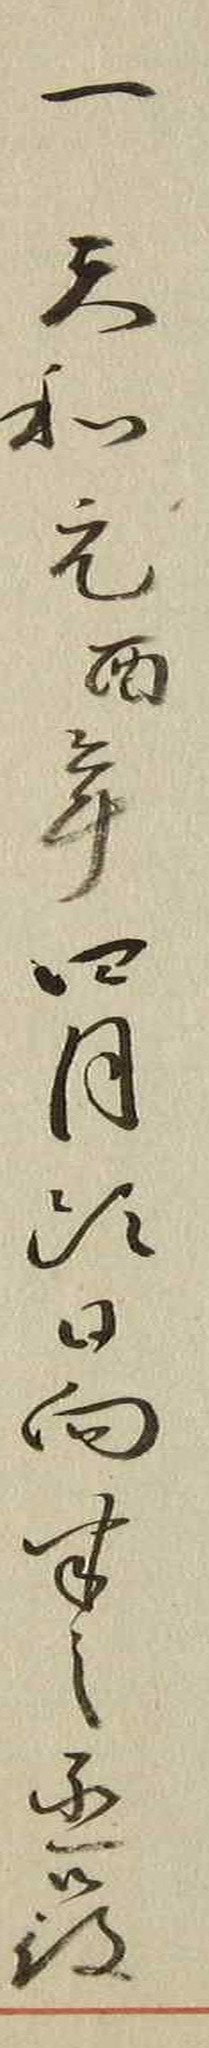一天和元酉年四月頭日向半之丞御役
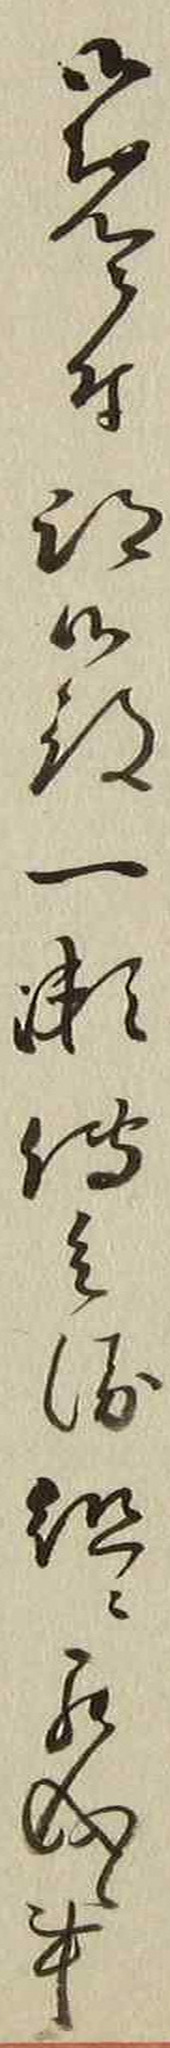御免ニ付跡御役一瀬伝兵衛組ニ罷成候事
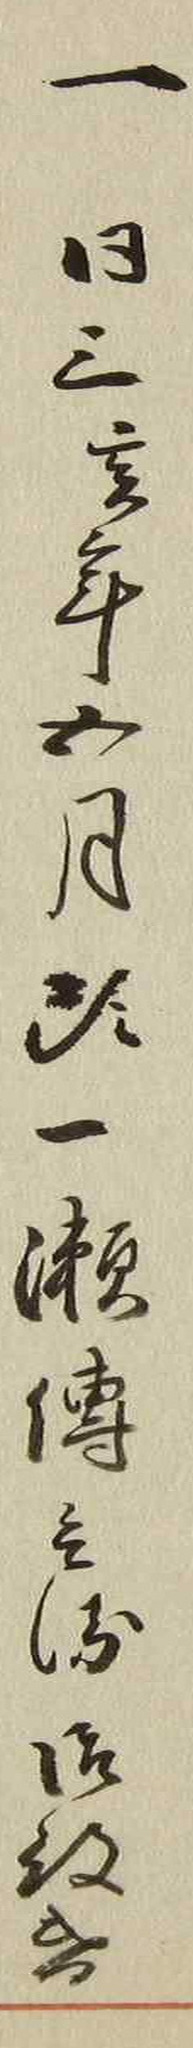一同三亥年五月頭一瀬伝兵衛御役替
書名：諸士系譜　巻之26　い之部26
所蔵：会津若松市立会津図書館
